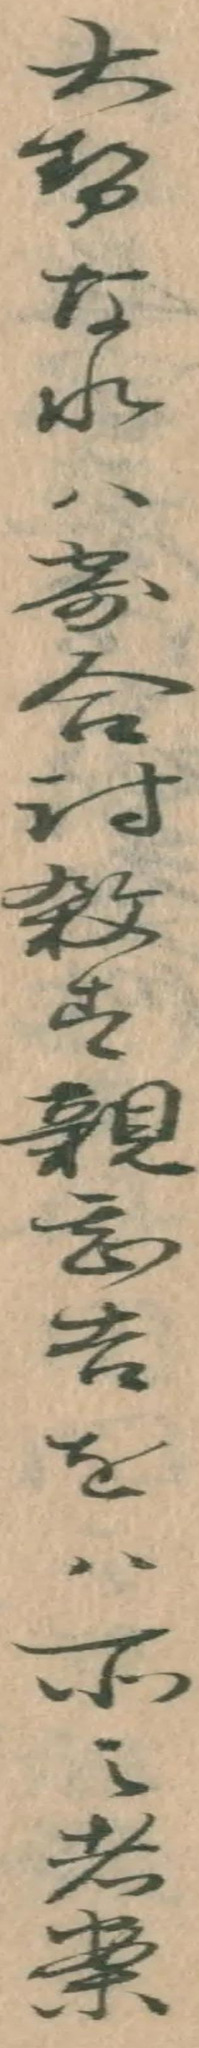大勢なれは寄合討殺す親甚吉をは所之者案
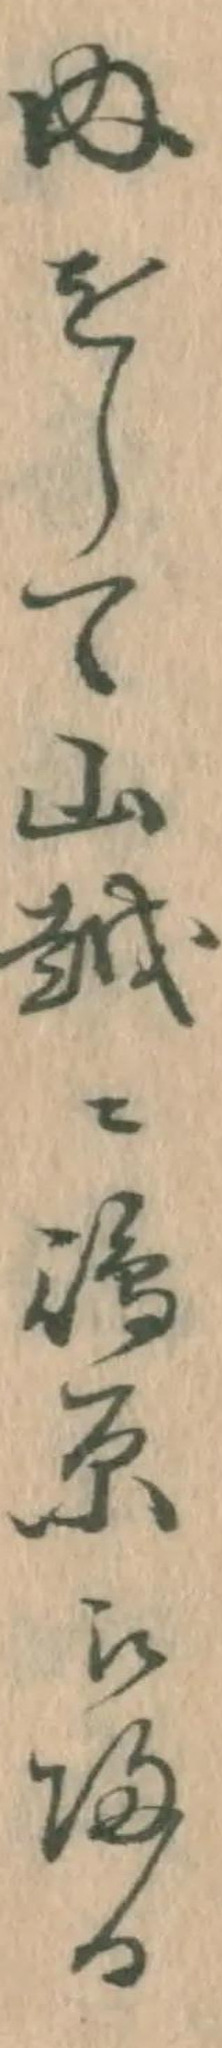内をして山越に島原え帰る
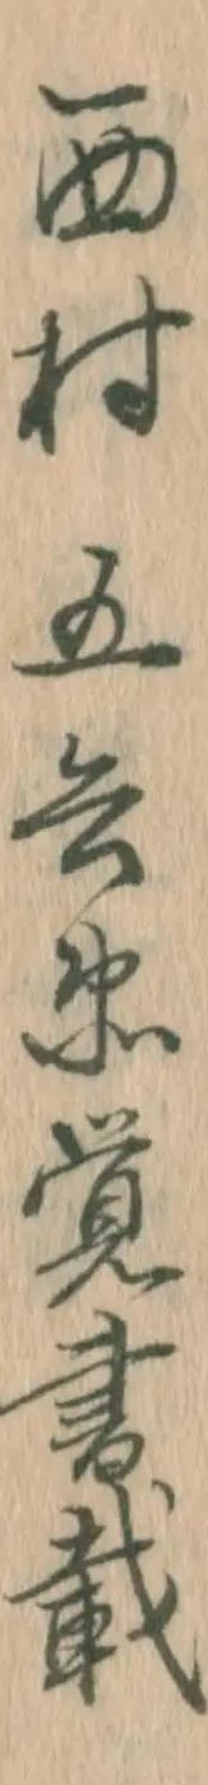西村五兵衛覚書載
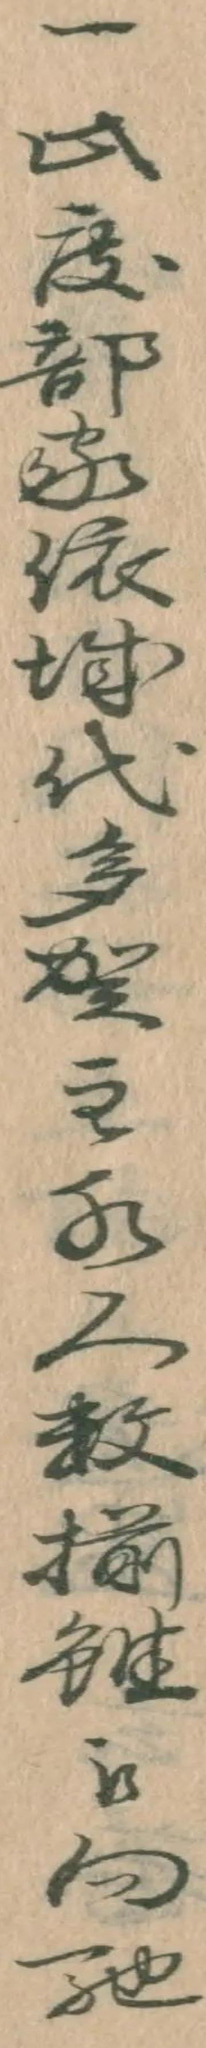一此度部家依城代多賀主水人数揃雖被向馳
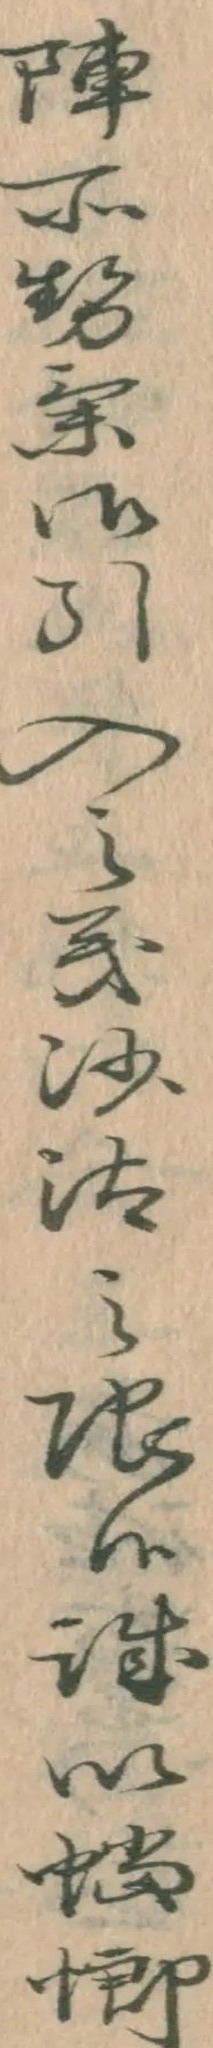陣所勢参御引入之義沙汰之限候誠以蟷螂
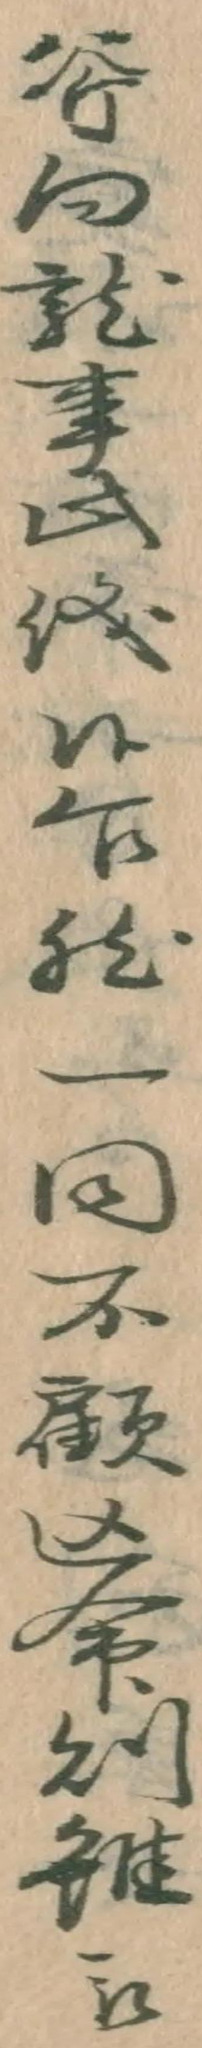斧向就事此儀候乍然一同不顧込命則雖被
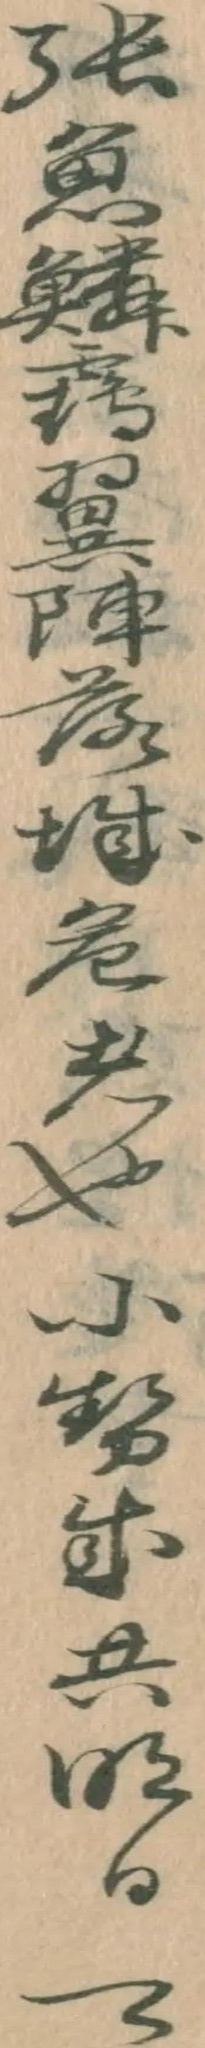張魚鱗鶴翼陣落城危者也小勢成共明日可

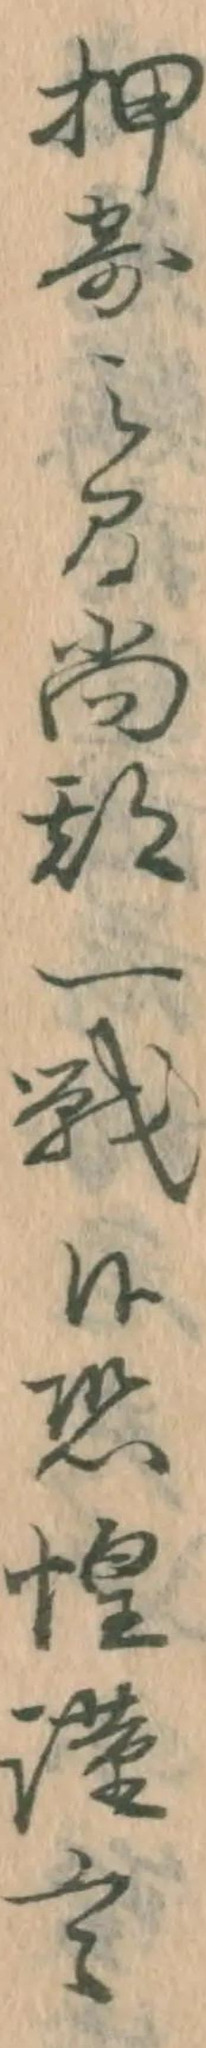押寄之間尚期一戦候恐惶謹言
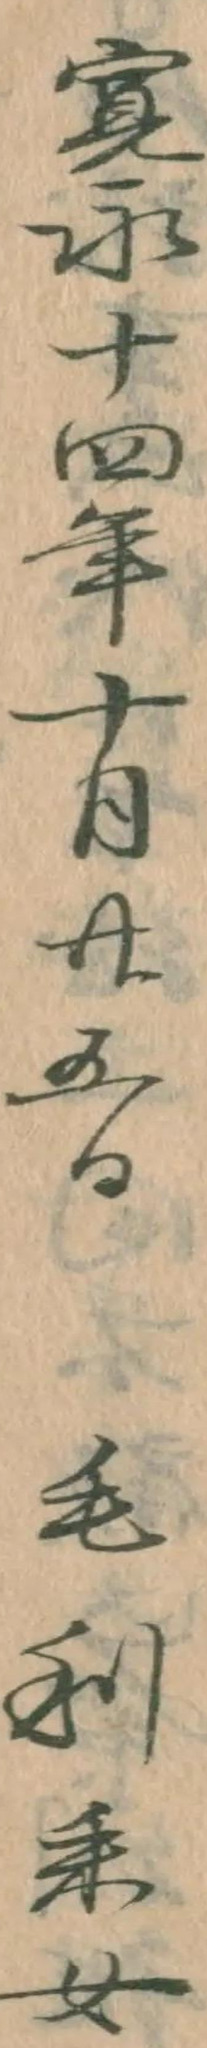寛永十四年十月廿五日毛利采女
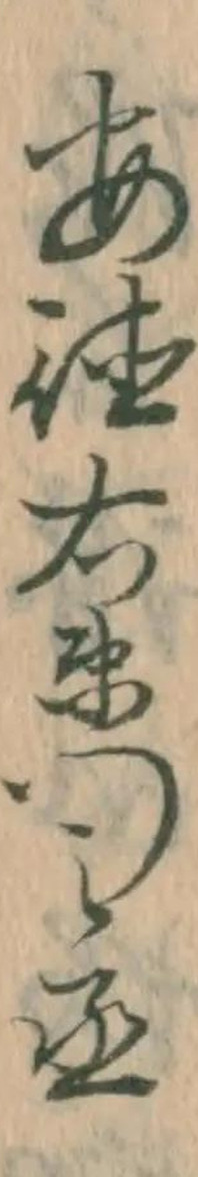安徳右衛門丞
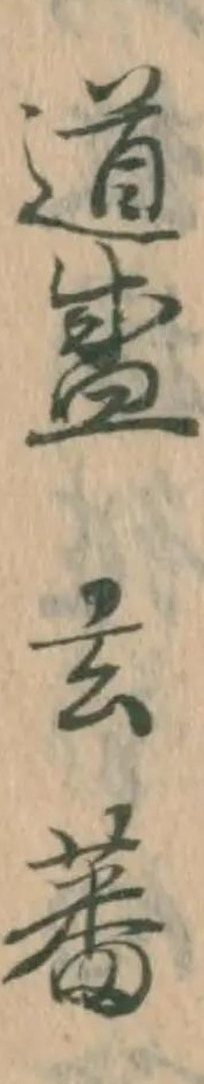道盛玄蕃
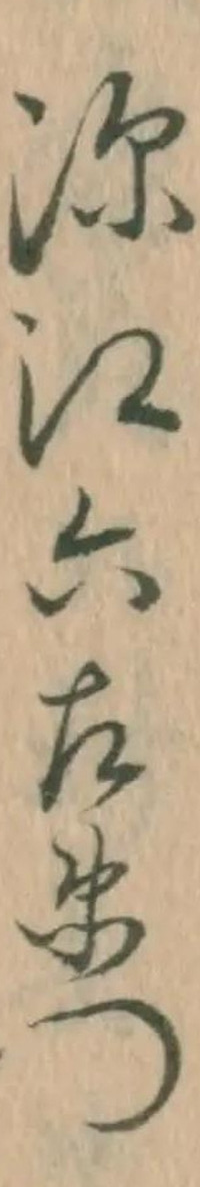深江六左衛門
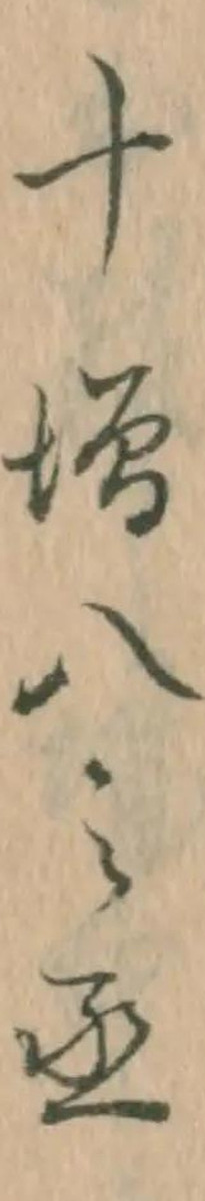十増八之丞
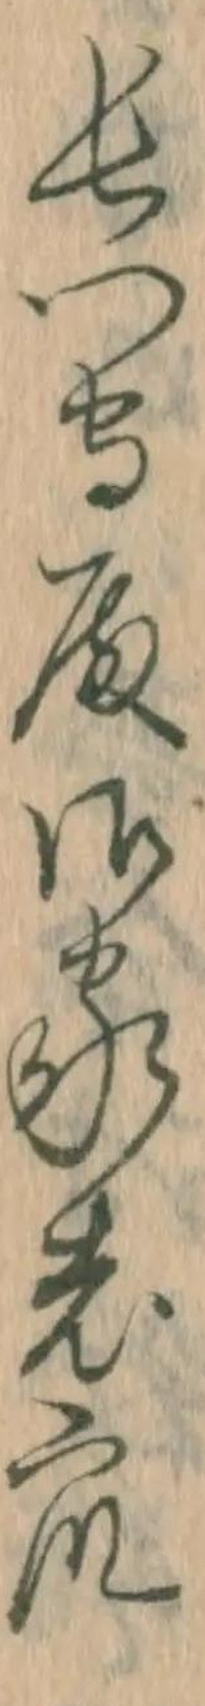長門守殿御家老衆
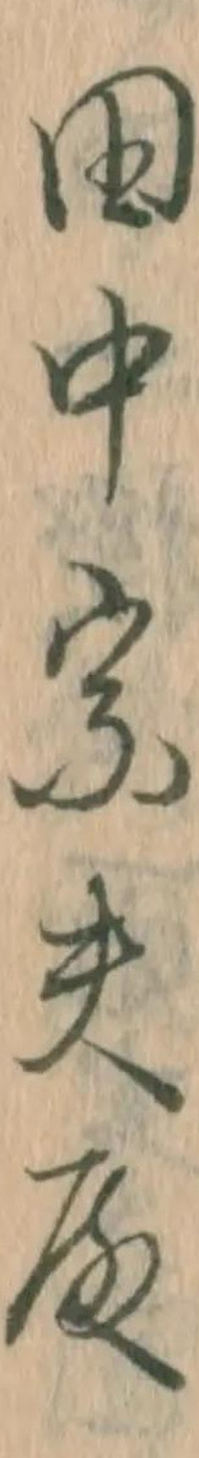田中宗夫殿
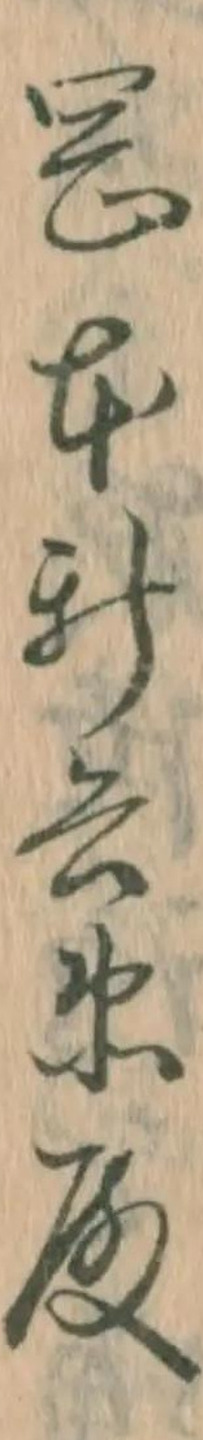岡本新兵衛殿
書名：切支丹御退治記 49巻. [1]
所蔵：国立国会図書館 National Diet Library, JAPAN
